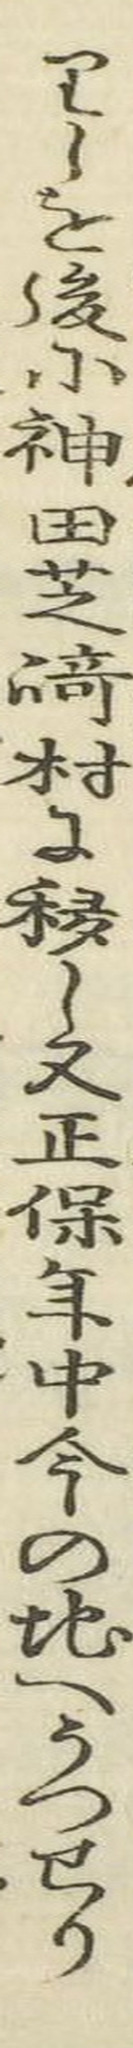りしを後に神田芝崎村に移し又正保年中今の地へうつせり
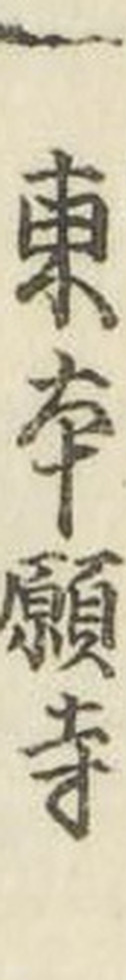東本願寺
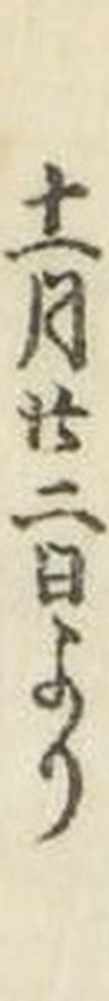十一月廿二日より
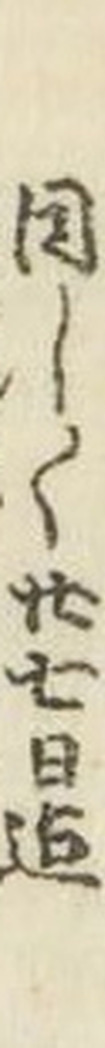同しく廿七日迄
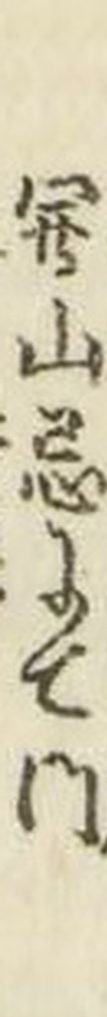開山忌にて門
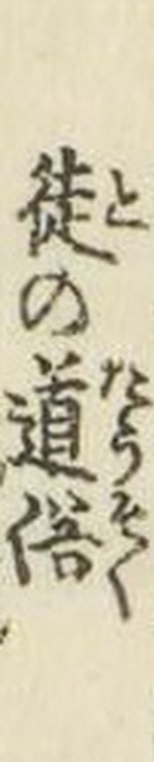徒の道俗
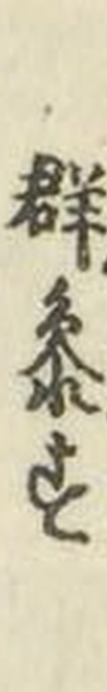群参す
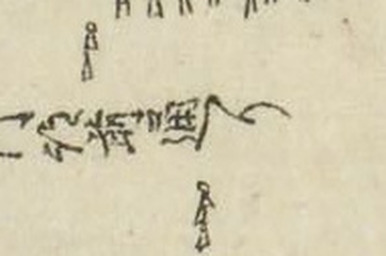門跡前通り
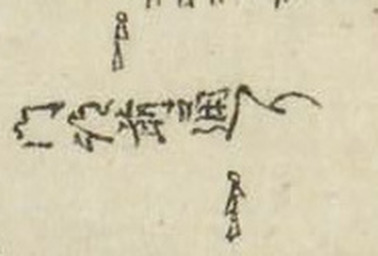門跡前通り
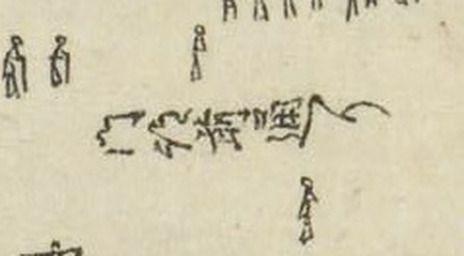門跡前通り

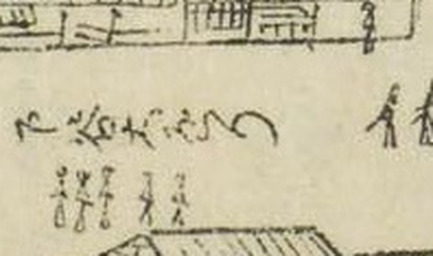下谷大通り
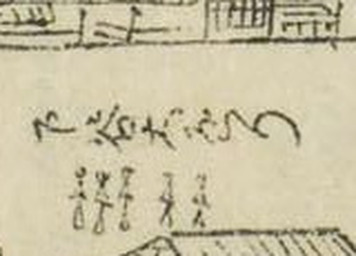下谷大通り

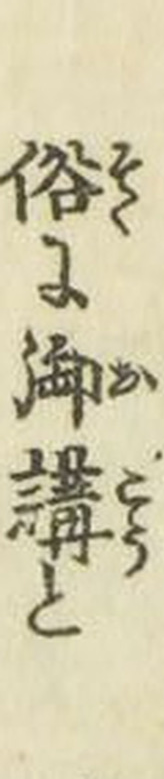俗に御講と
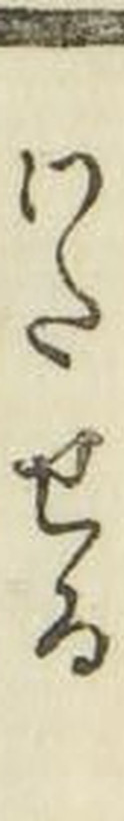わたせる
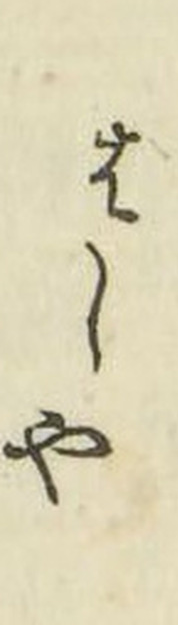はしや
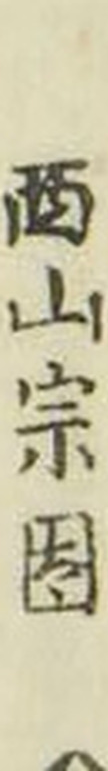西山宗因
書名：江戸名所図会 20巻 巻之16
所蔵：東京学芸大学教育コンテンツアーカイブ
